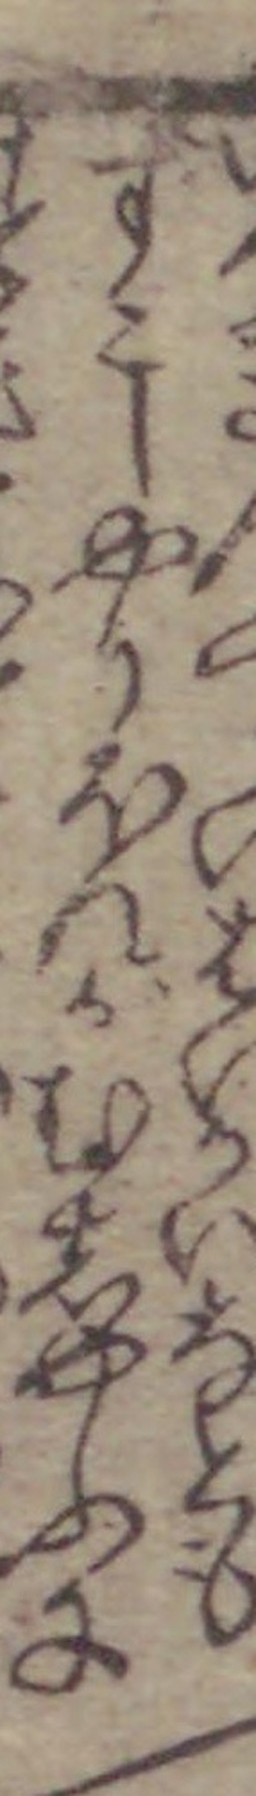すこしやりほんかむしやうに
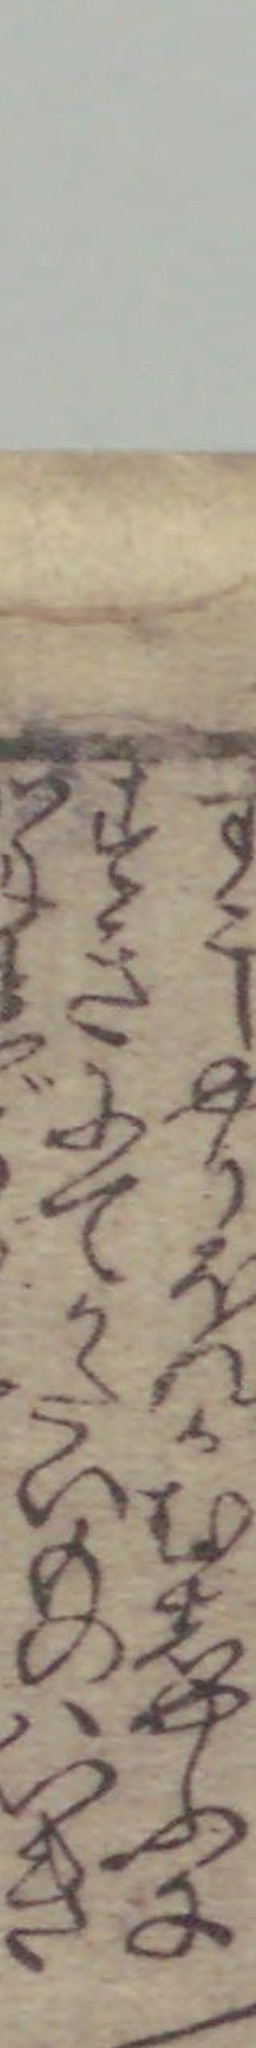すきにてかたいものはいき
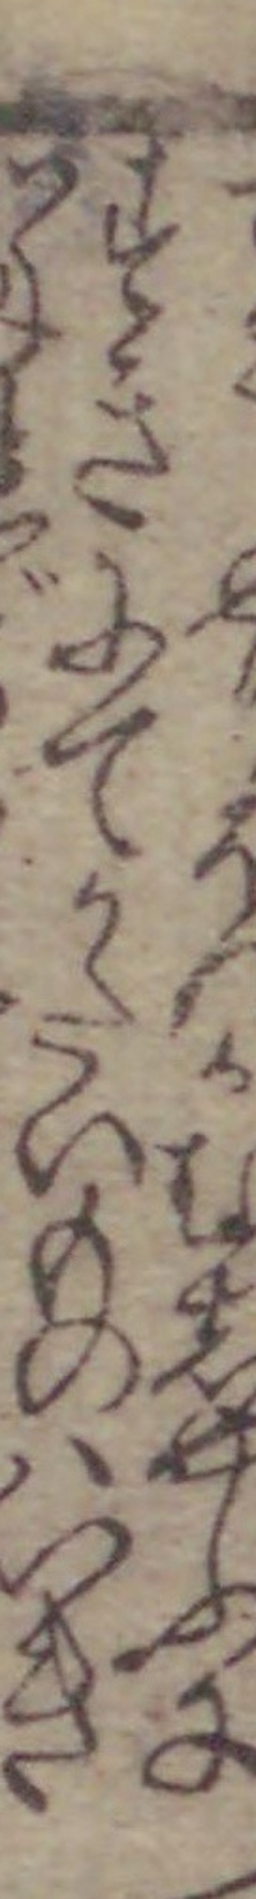すきにてかたいものはいき
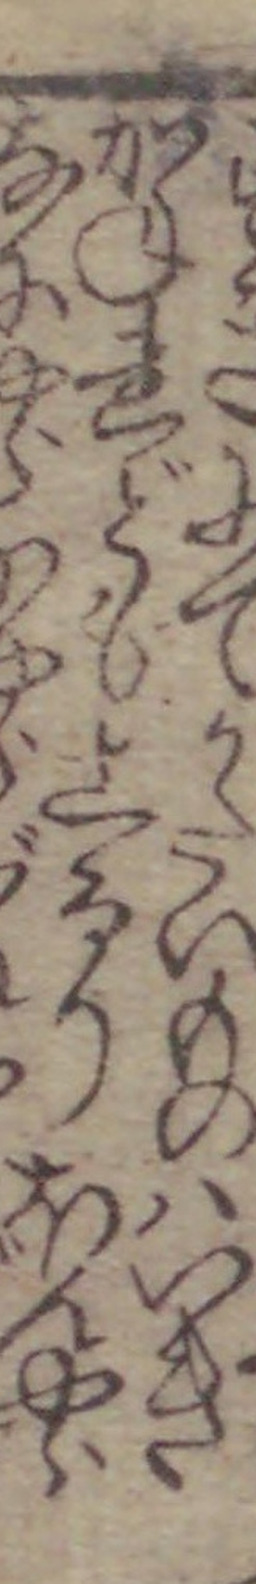かねれども上るりほんやら
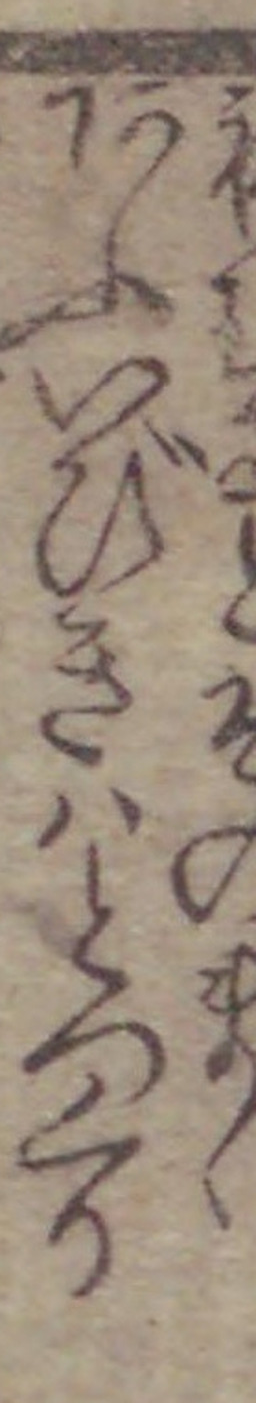あふいびきはとつくり
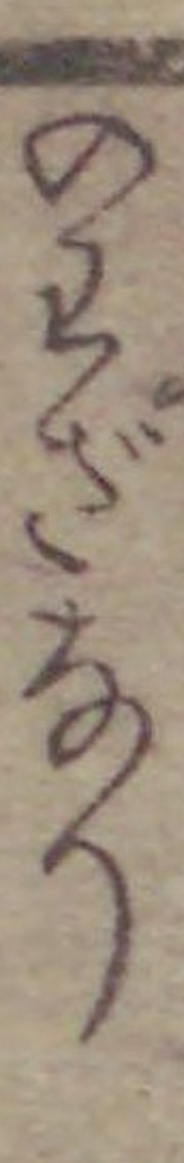のわざなり

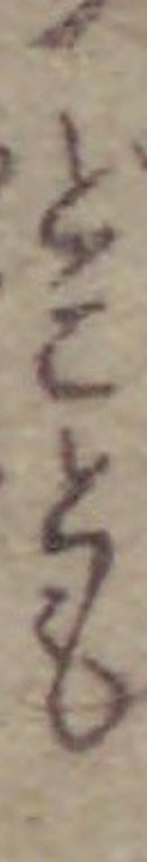どことも
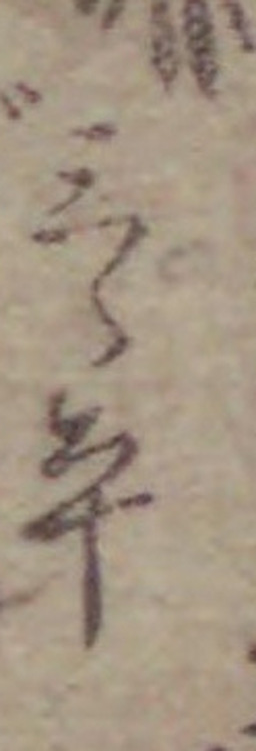三郎平
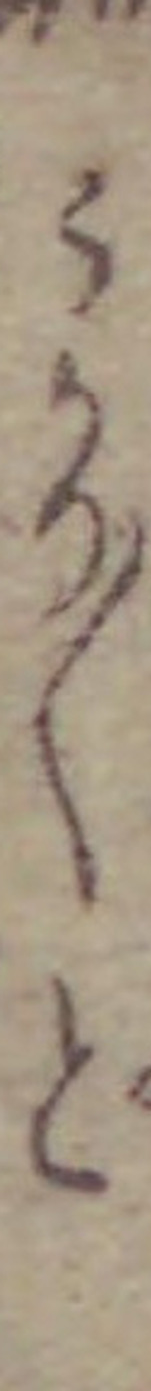うかり〳〵と
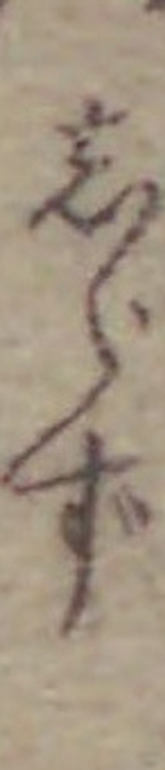しらず
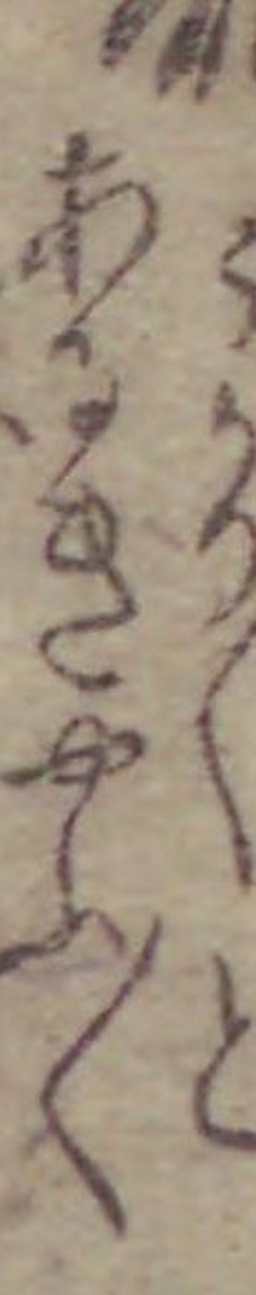あるきやふ〳〵
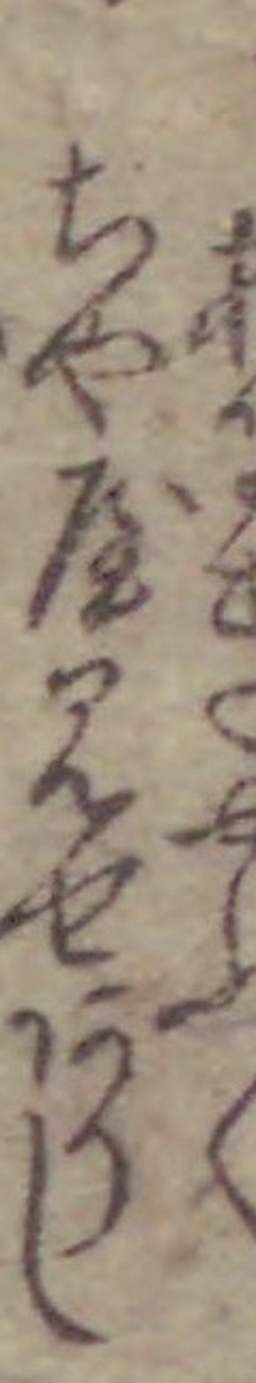ちや屋みせありし
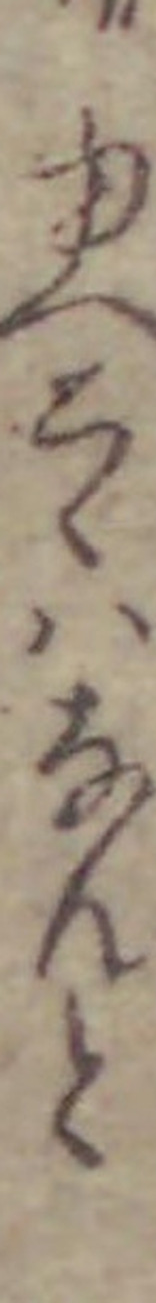ゆへこゝはなんと
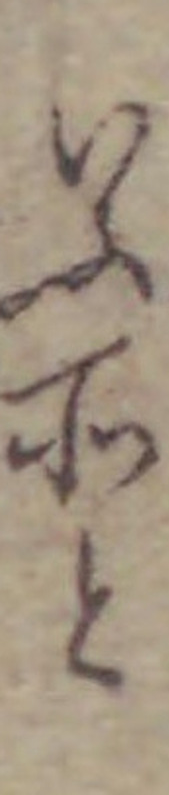いふ所と
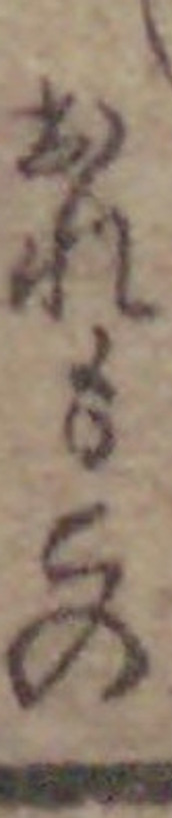おれもこの
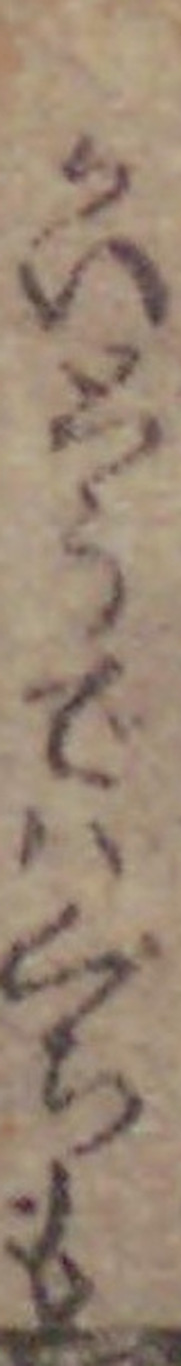かいどうではくちも
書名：近頃嶋めぐり 3巻
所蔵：国立国会図書館 National Diet Library, JAPAN
